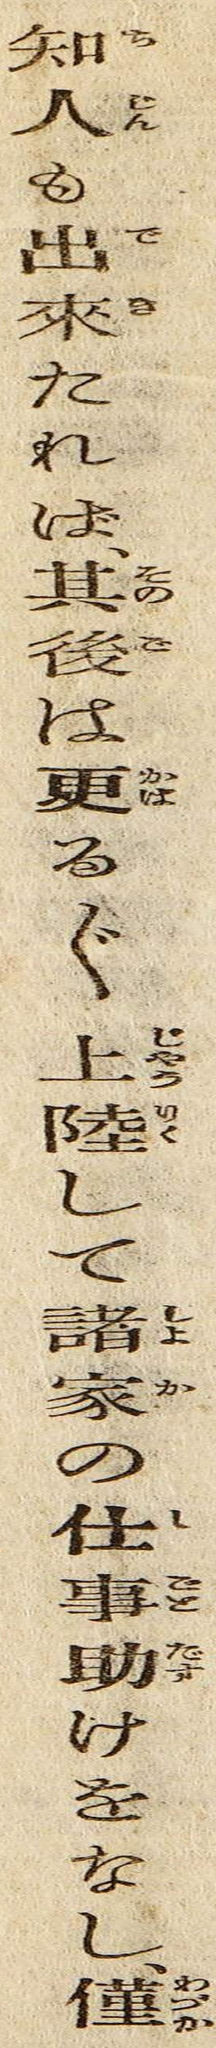知人も出来たれば、其後は更る〴〵上陸して諸家の仕事助けをなし、僅
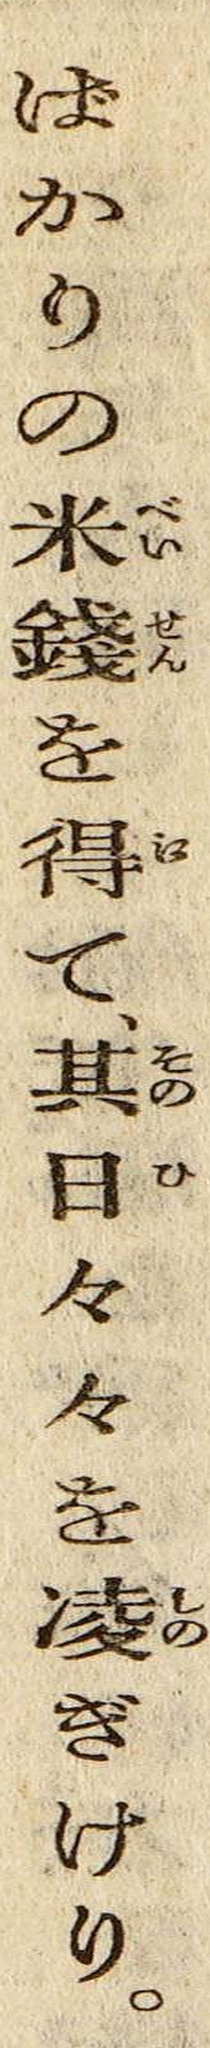ばかりの米銭を得て、其日々々を凌ぎけり。
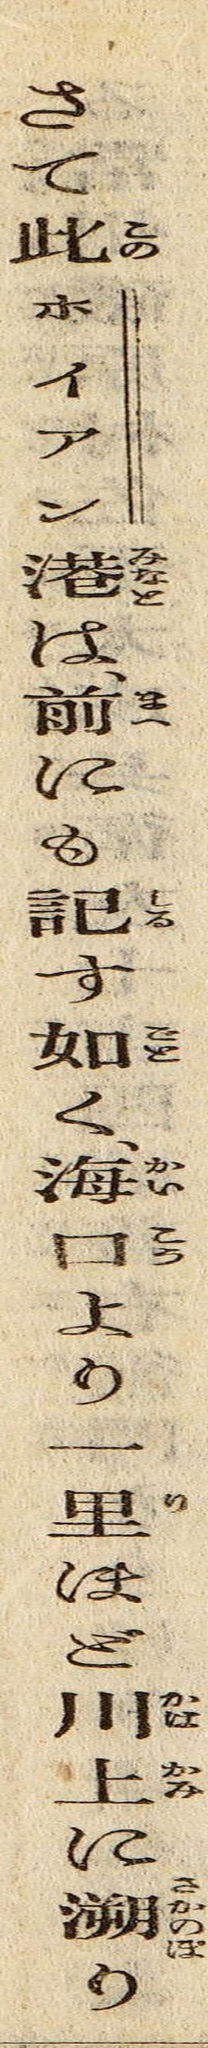さて此ホイアン港は、前にも記す如く、海口より一里ほど川上に溯り
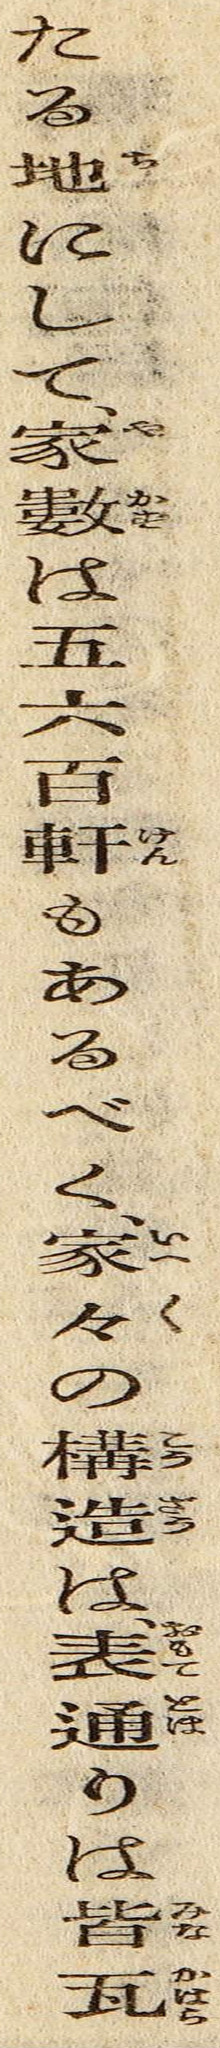たる地にして、家数は五六百軒もあるべく、家々の構造は、表通りは皆瓦
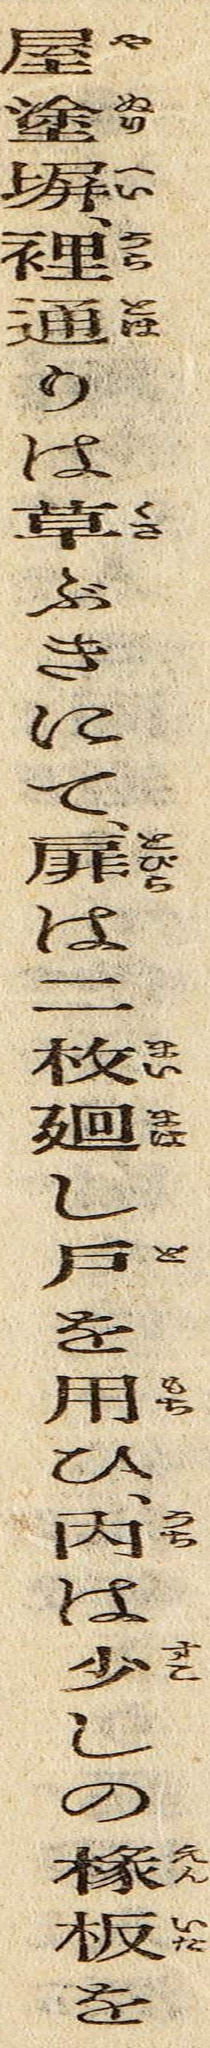屋塗塀、裡通りは草ぶきにて、扉は二枚廻し戸を用ひ、内は少しの椽板を
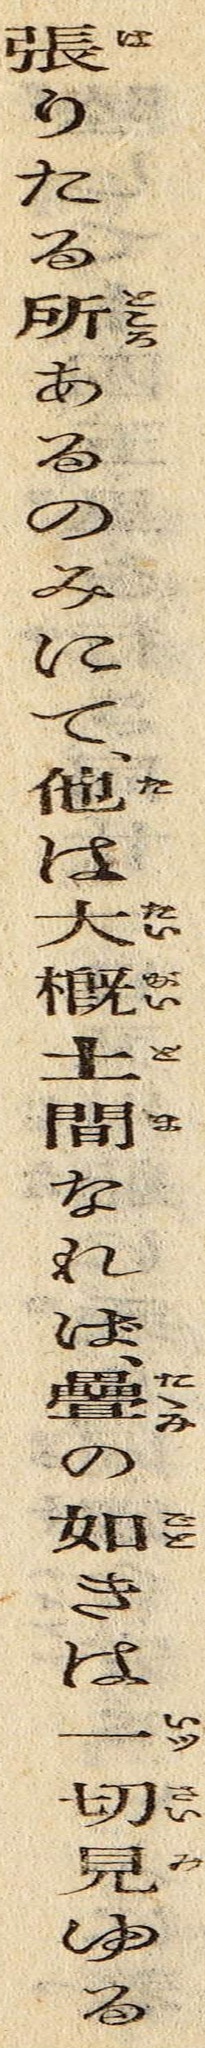張りたる所あるのみにて、他は大概土間なれば、畳の如きは一切見ゆる
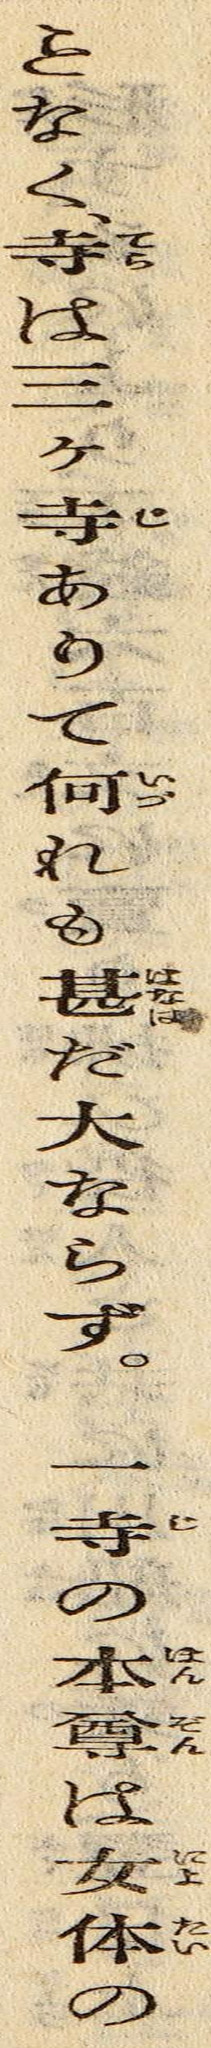ことなく、寺は三ケ寺ありて何れも甚だ大ならず。一寺の本尊は女体の
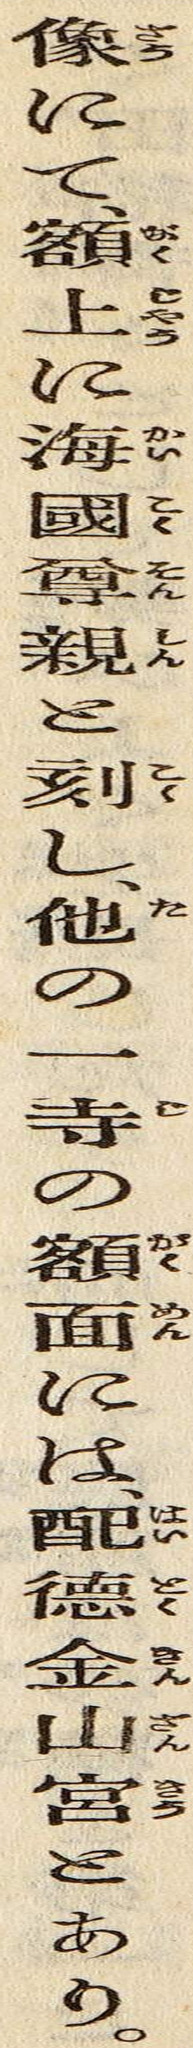像にて、額上に海国尊親と刻し、他の一寺の額面には、配徳金山宮とあり。
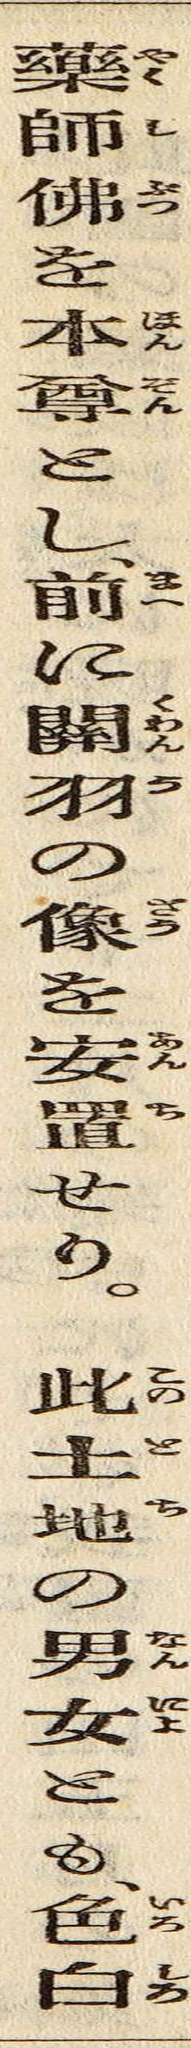薬師仏を本尊とし、前に関羽の像を安置せり。此土地の男女とも、色白
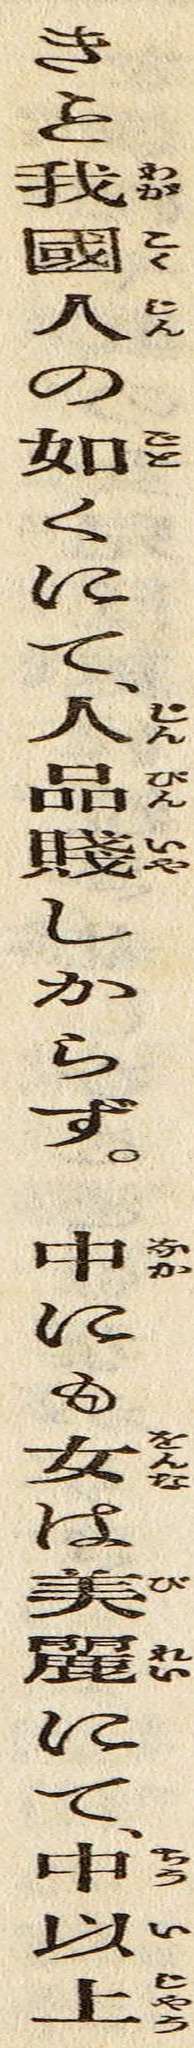きこと我国人の如くにて、人品賤しからず。中にも女は美麗にて、中以上
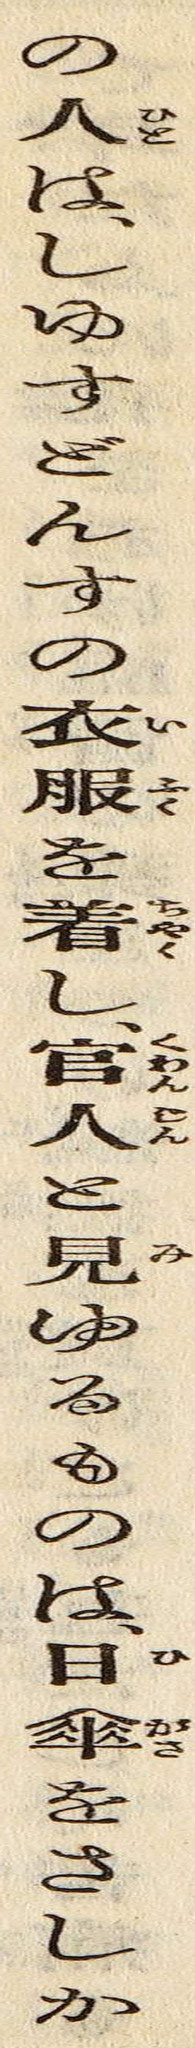の人は、しゆすどんすの衣服を着し、官人と見ゆるものは、日傘をさしか
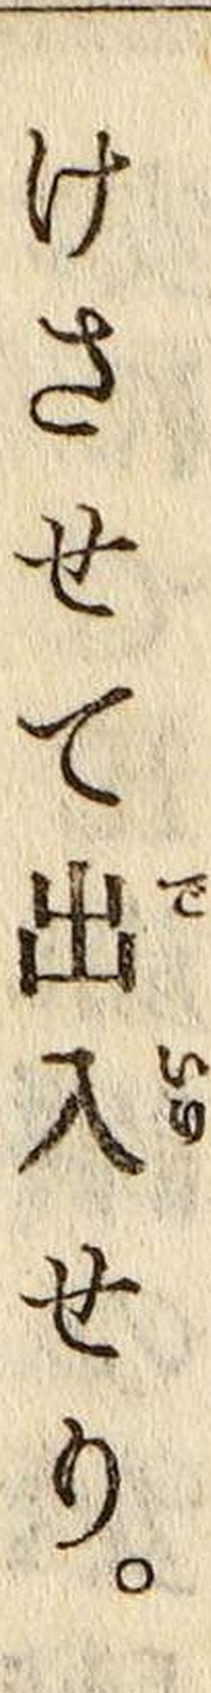けさせて出入せり。
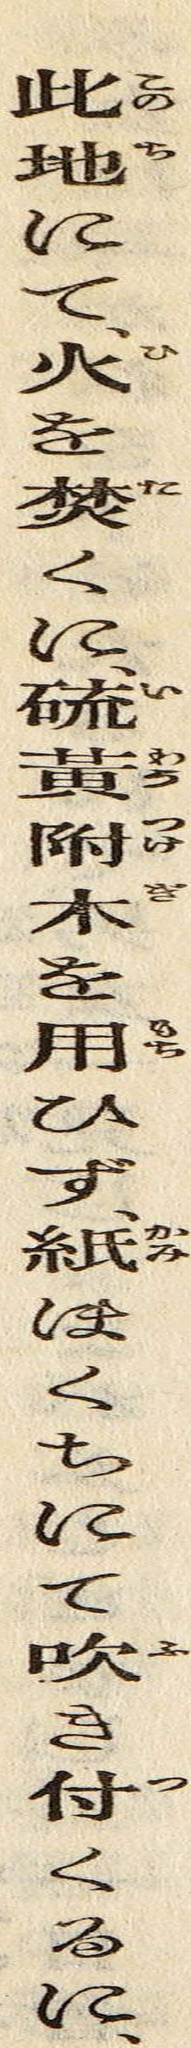此地にて、火を焚くに、硫黄附木を用ひず、紙ほくちにて吹き付くるに、
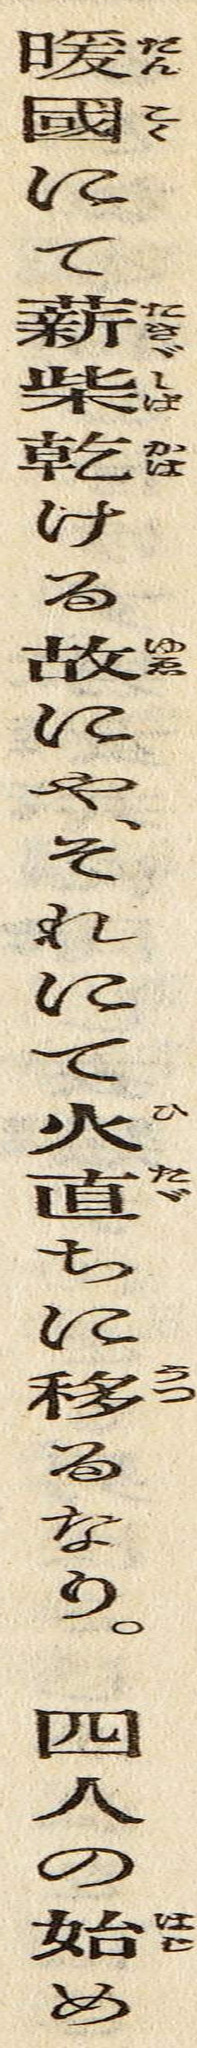暖国にて薪柴乾ける故にや、それにて火直ちに移るなり。四人の始め
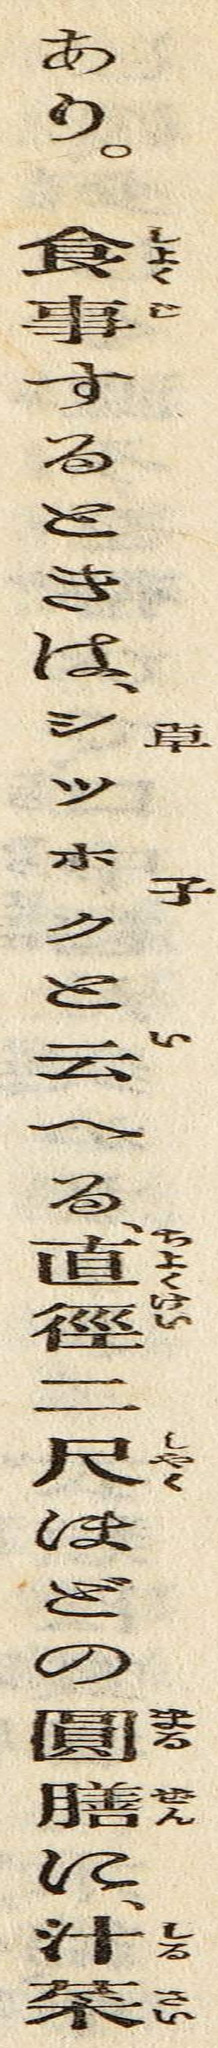あり。食事するときは、シツホクと云へる、直径二尺ほどの円膳に、汁菜
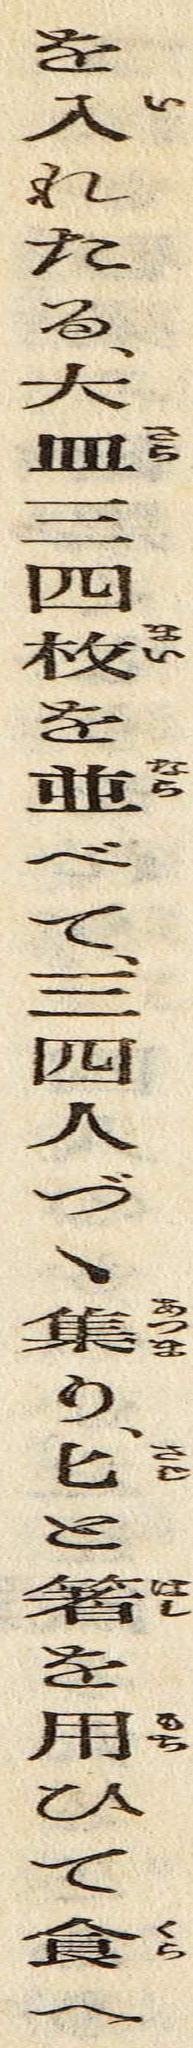を入れたる、大皿三四枚を並べて、三四人づヽ集り、匕と箸を用ひて食へ
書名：日本漂流譚
